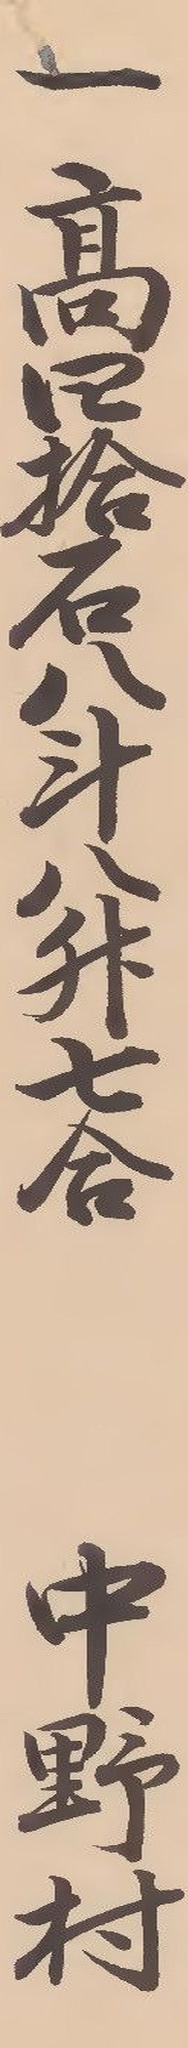一高四拾石八斗八升七合中野村
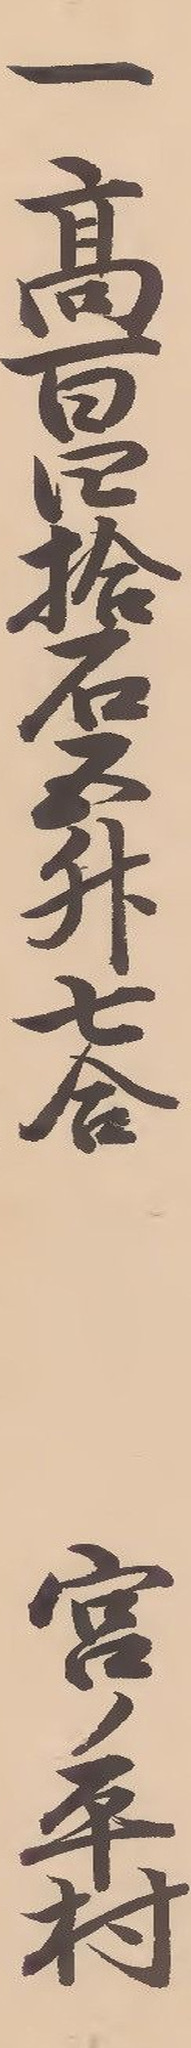一高百四拾石五升七合宮ノ平村

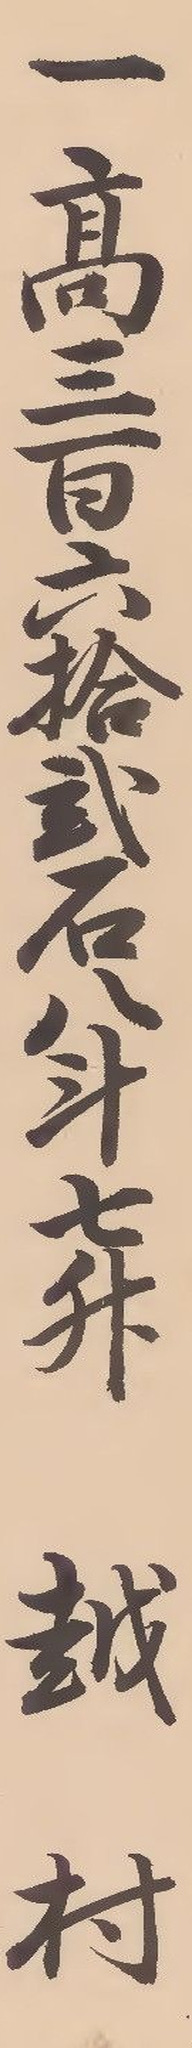一高三百六拾弐石八斗七升越村
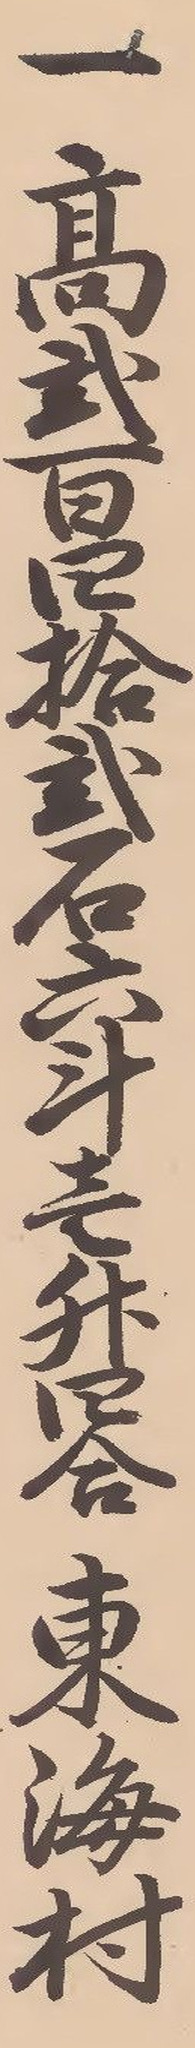一高弐百四拾弐石六斗壱升四合東海村
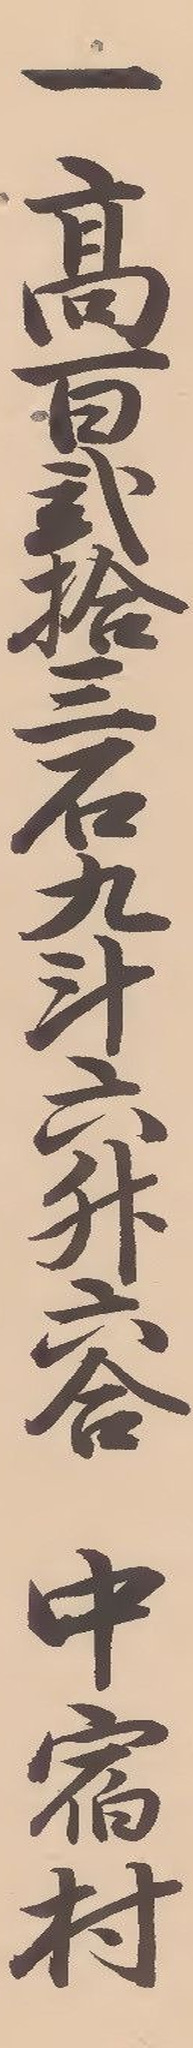一高百弐拾三石九斗六升六合中宿村
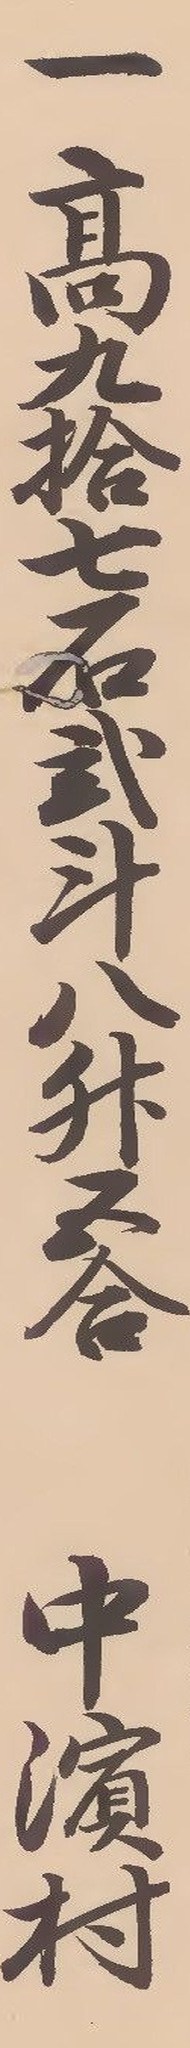一高九拾七石弐斗八升五合中浜村
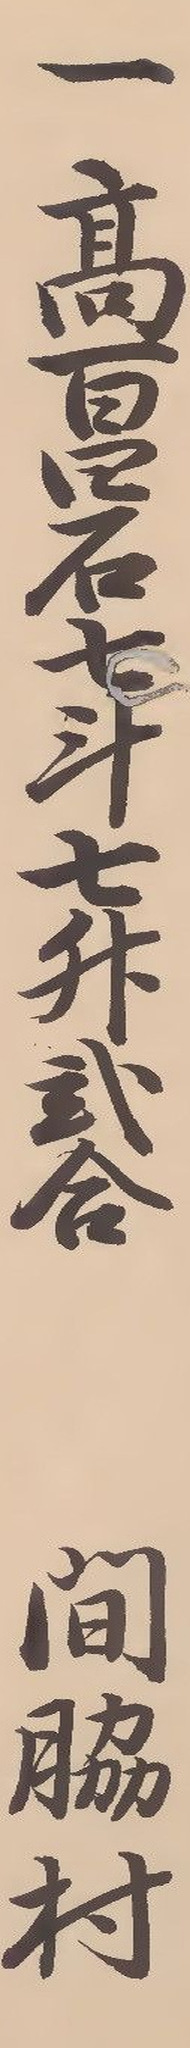一高百四石七斗七升弐合間脇村
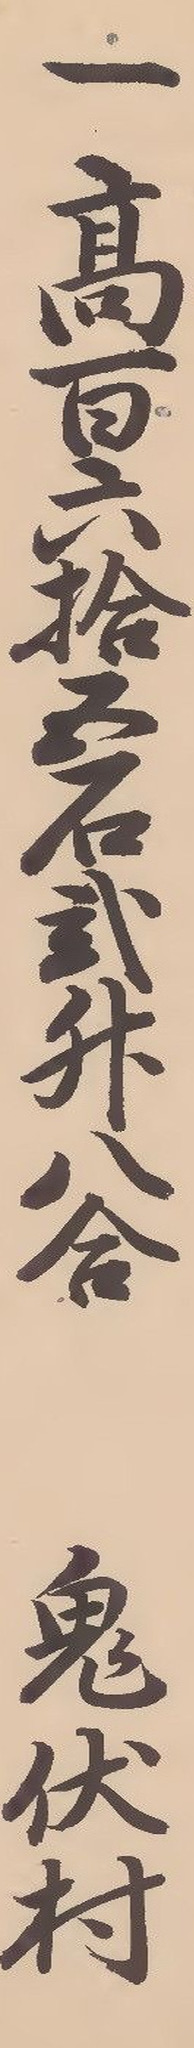一高百六拾五石弐升八合鬼伏村
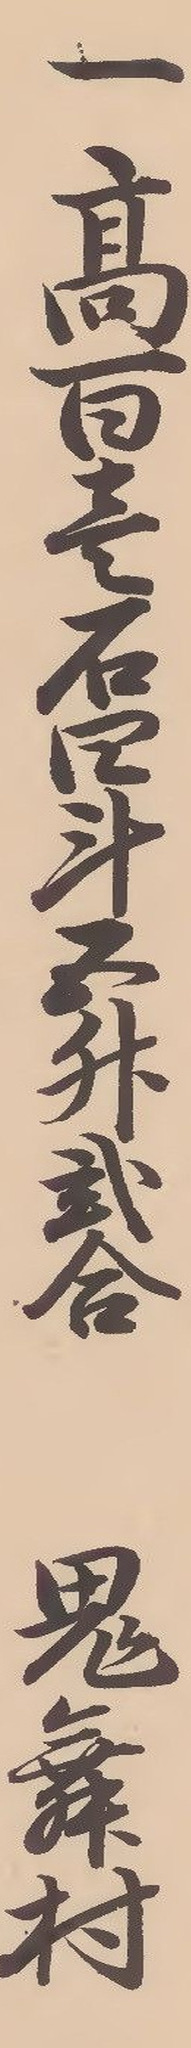一高百壱石四斗五升弐合鬼舞村
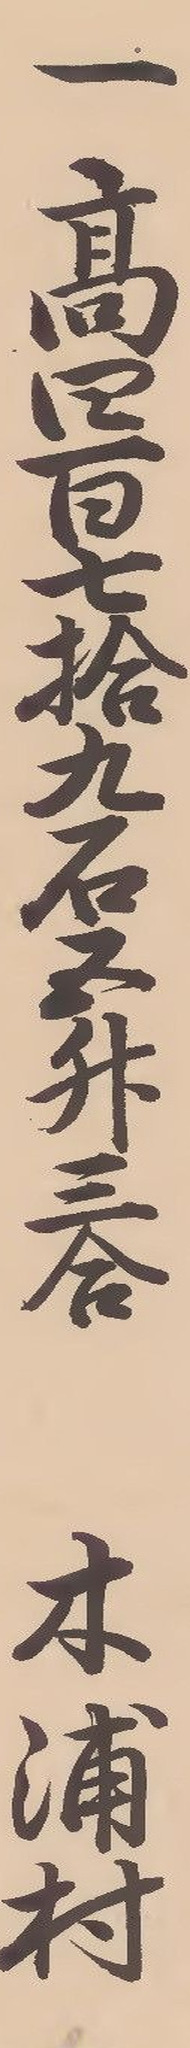一高四百七拾九石五升三合木浦村

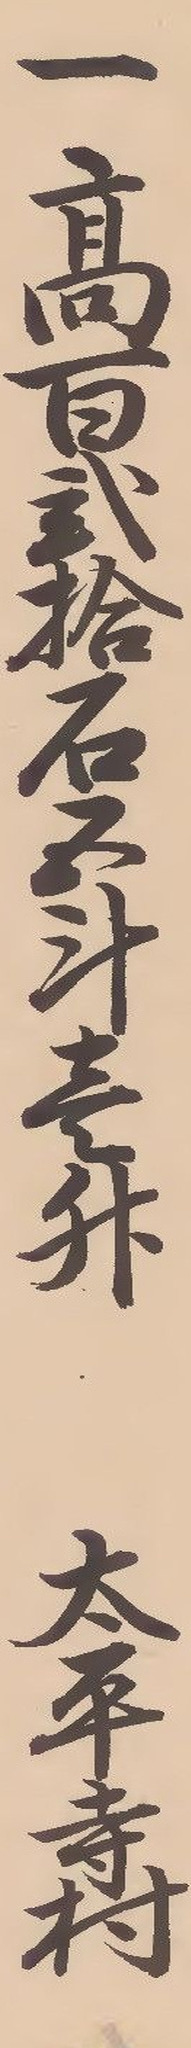一高百弐拾石五斗壱升太平寺村
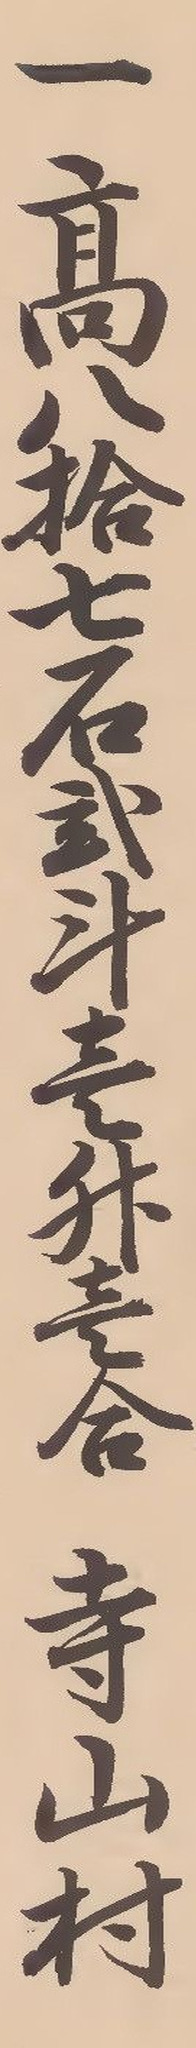一高八拾七石弐斗壱升壱合寺山村
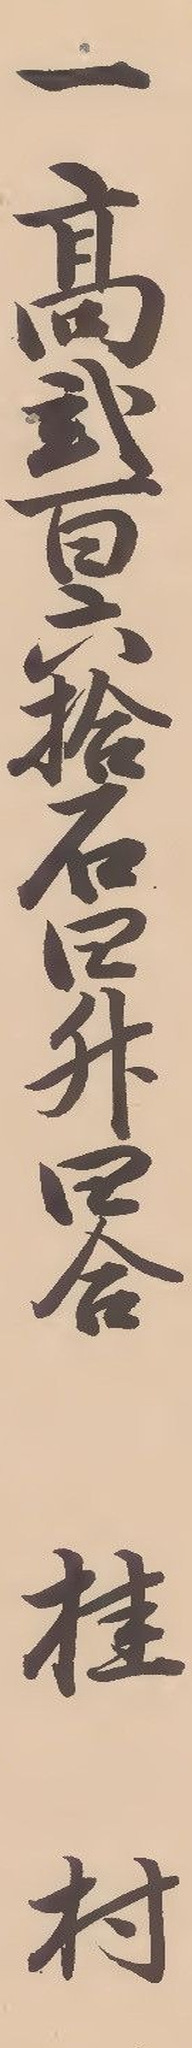一高弐百六拾石四升四合桂村
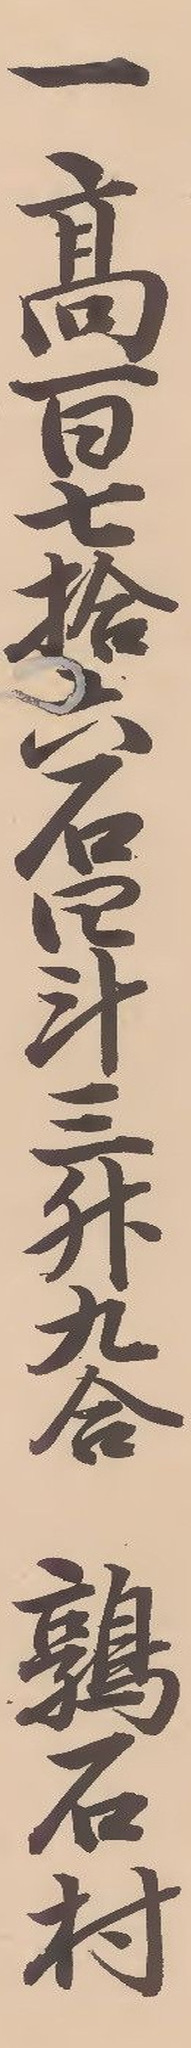一高百七拾六石四斗三升九合鶉石村
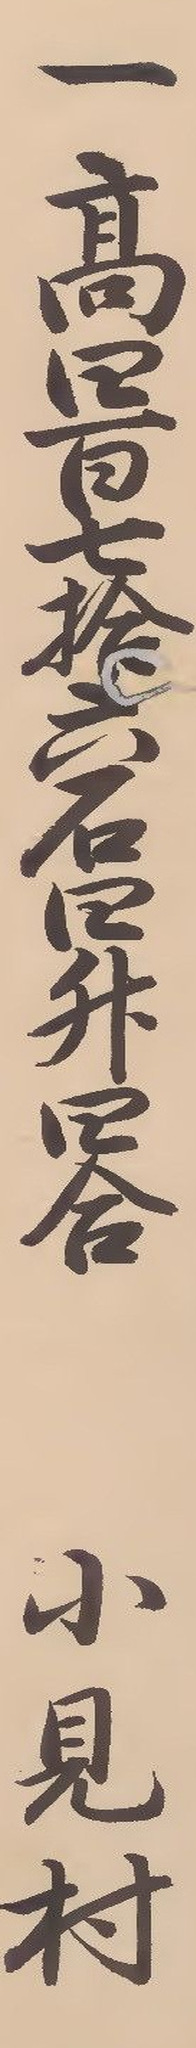一高四百七拾六石四升四合小見村
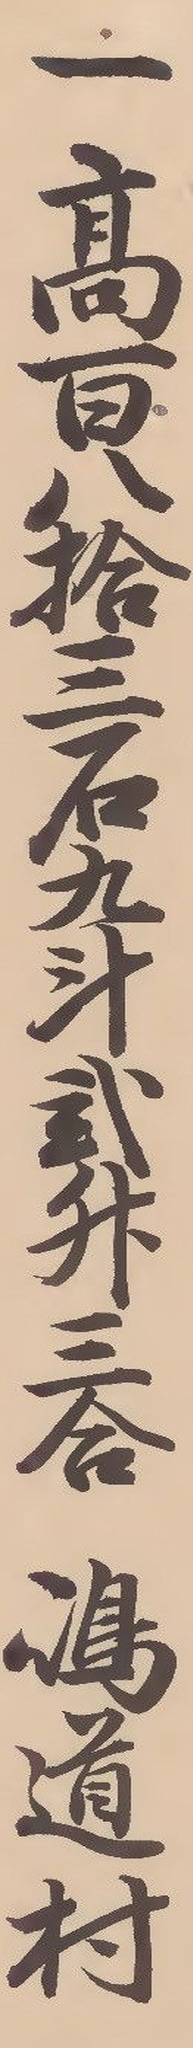一高百八拾三石九斗弐升三合島道村
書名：越後国郷帳　上
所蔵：国立公文書館 National Archives of Japan
